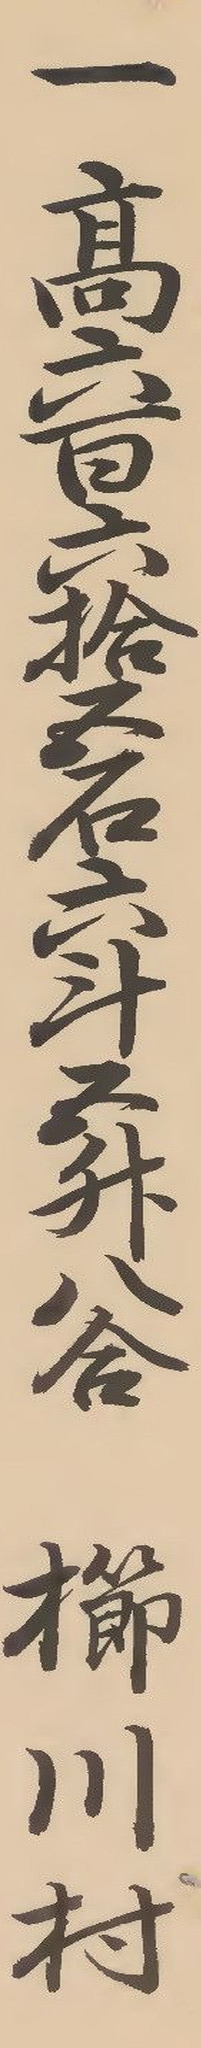一高六百六拾五石六斗五升八合櫛川村
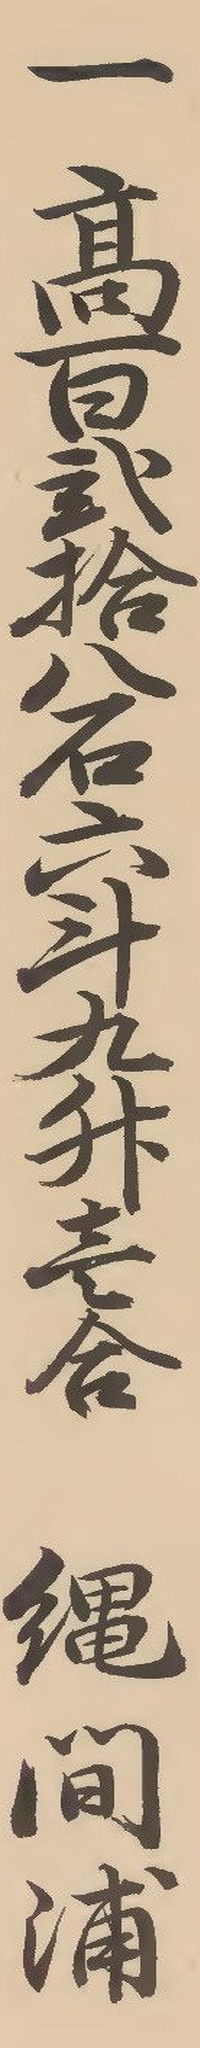一高百弐拾八石六斗九升壱合縄間浦
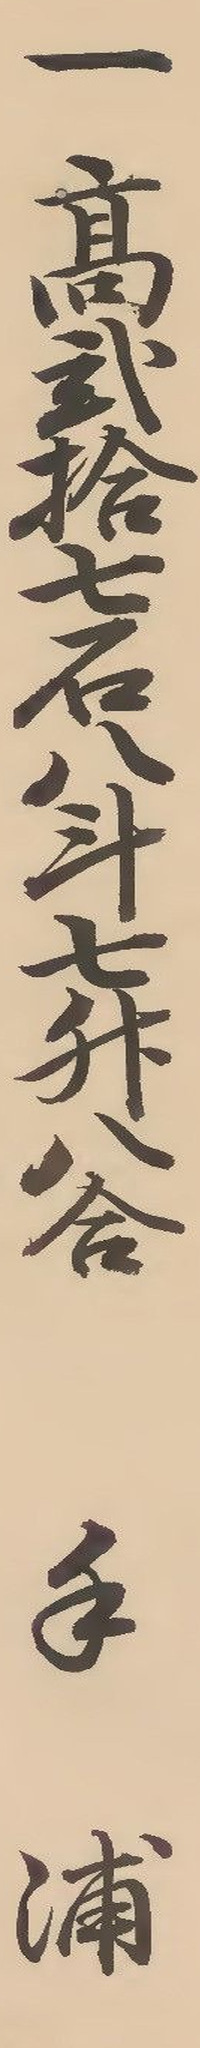一高弐拾七石八斗七升八合手浦
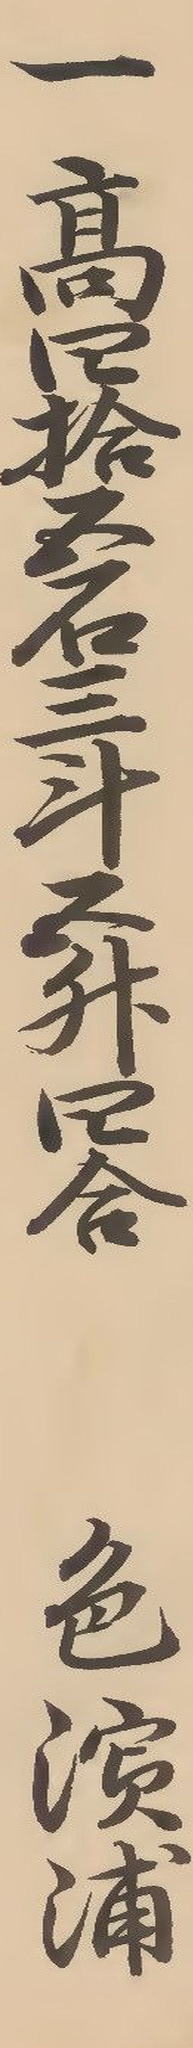一高四拾五石三斗五升四合色浜浦
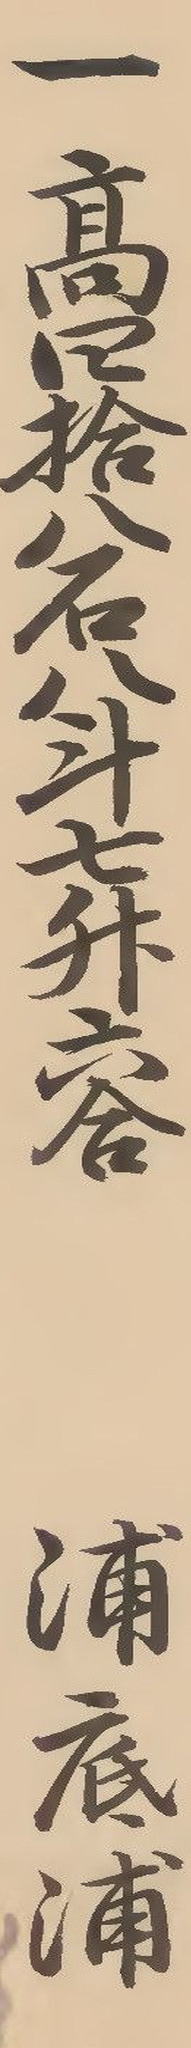一高四拾八石八斗七升六合浦底浦
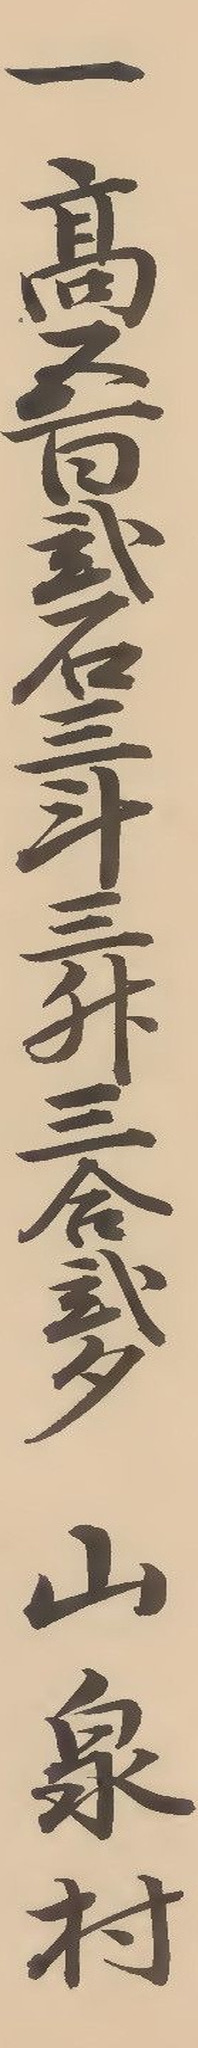一高五百弐石三斗三升三合弐勺山泉村
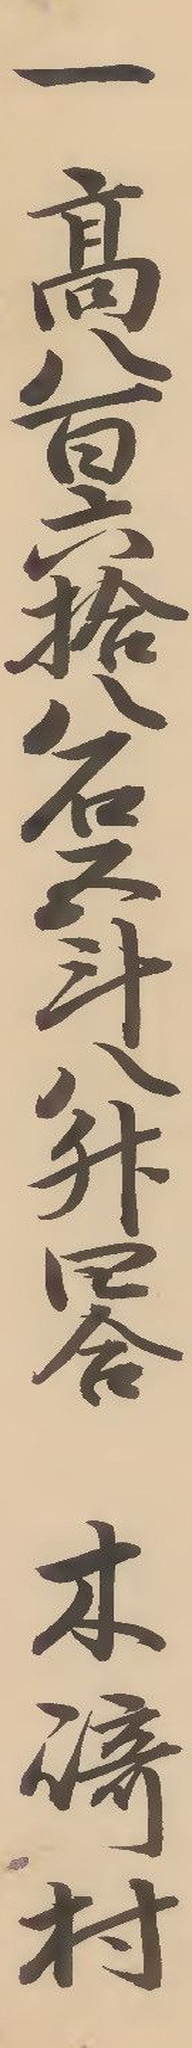一高八百六拾八石五斗八升四合木崎村

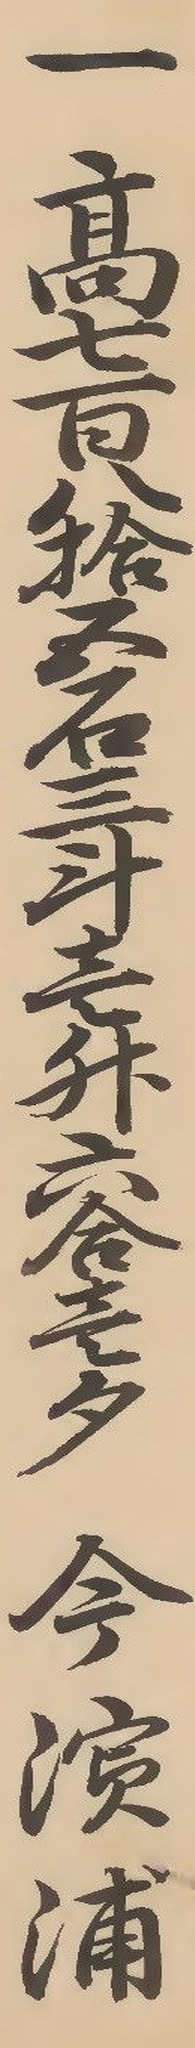一高七百八拾五石三斗壱升六合壱勺今浜浦
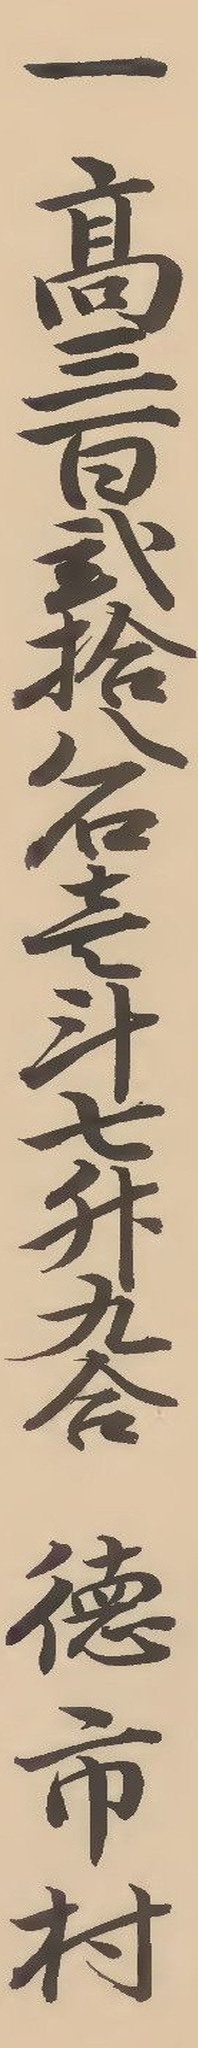一高三百弐拾八石壱斗七升九合徳市村
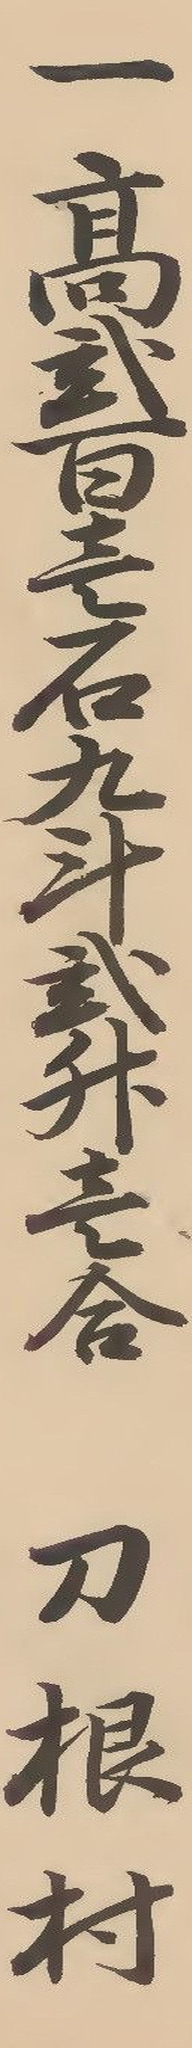一高弐百壱石九斗弐升壱合刀根村
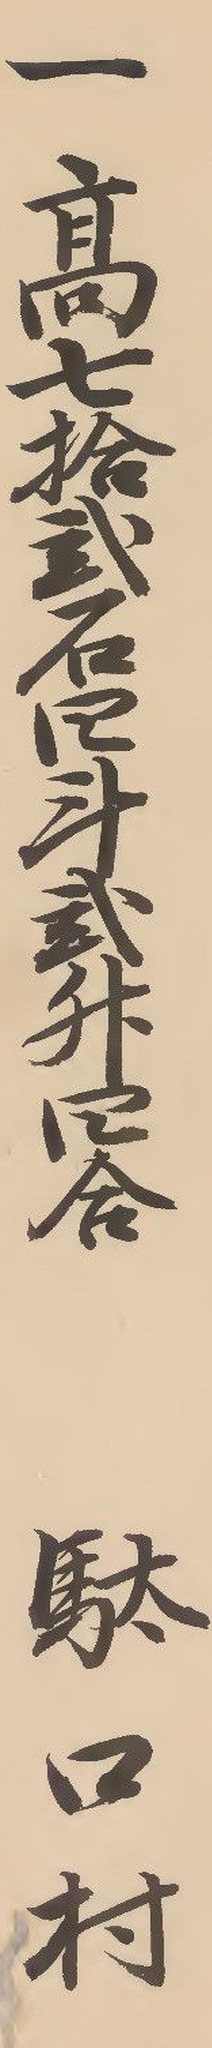一高七拾弐石四斗弐升四合駄口村
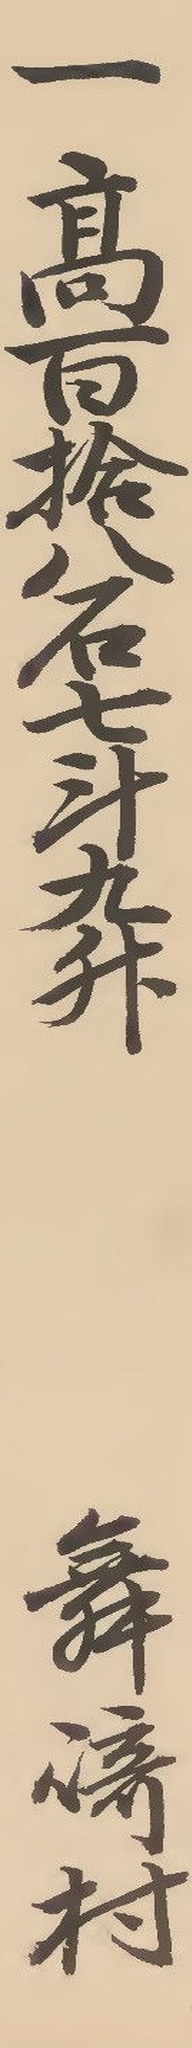一高百拾八石七斗九升舞崎村
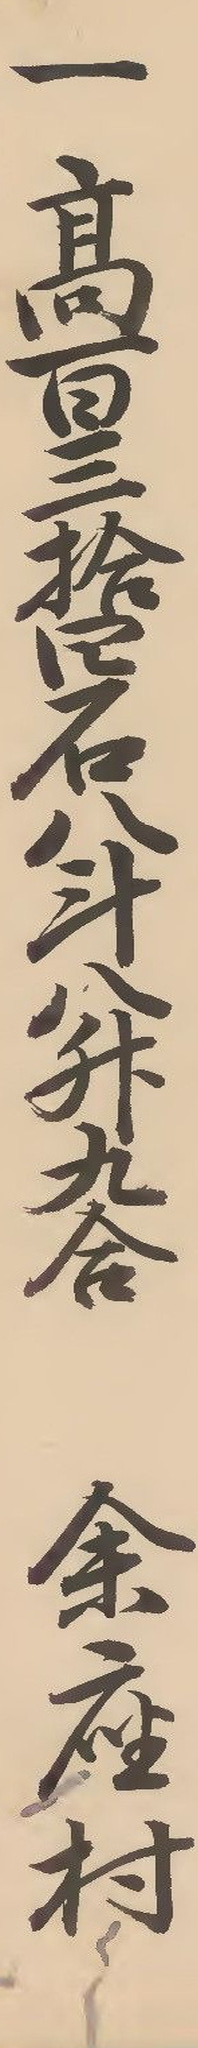一高百三拾四石八斗八升九合余座村

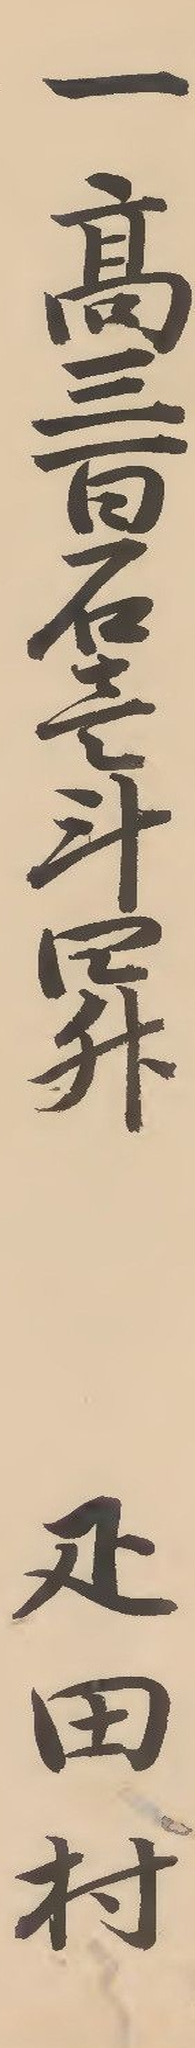一高三百石壱斗四升疋田村
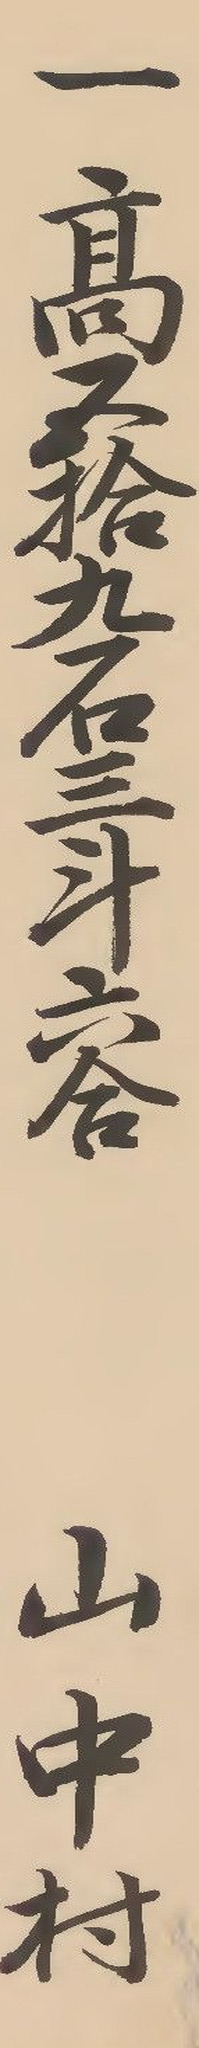一高五拾九石三斗六合山中村
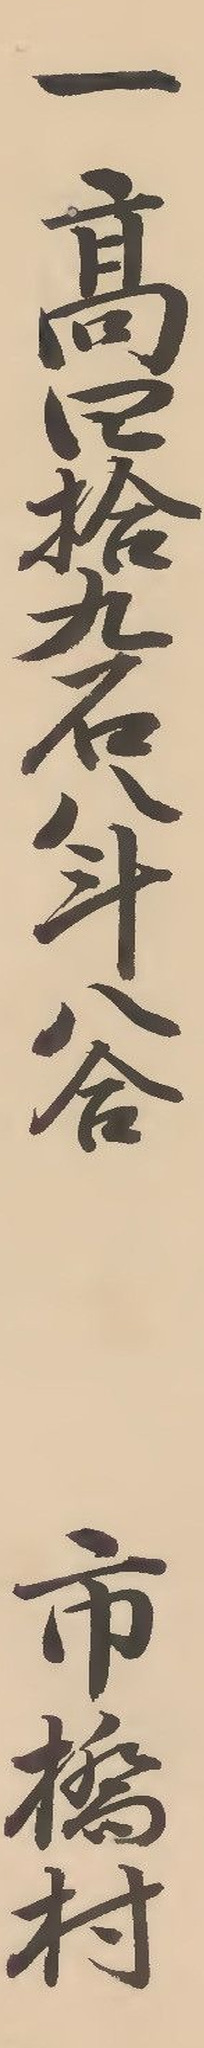一高四拾九石八斗八合市橋村
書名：越前国郷帳
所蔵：国立公文書館 National Archives of Japan
